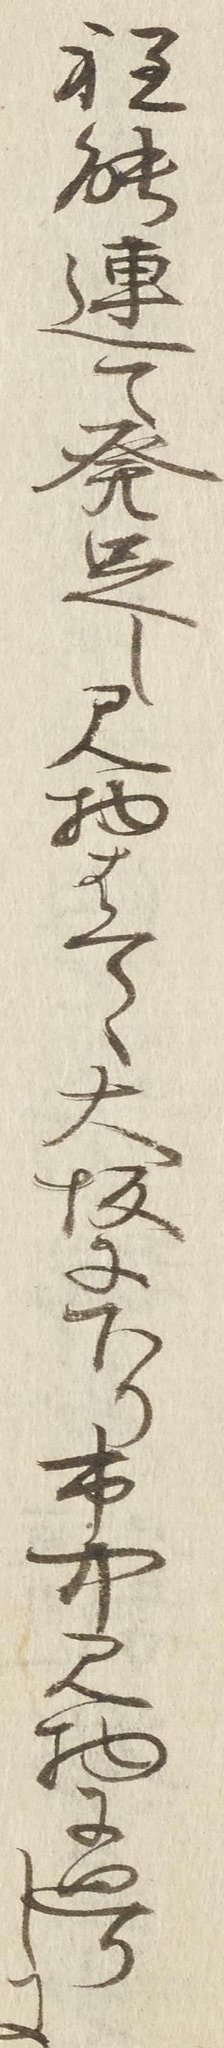程能連て発足し見物はてゝ大坂に下り市中見物に廻りしに
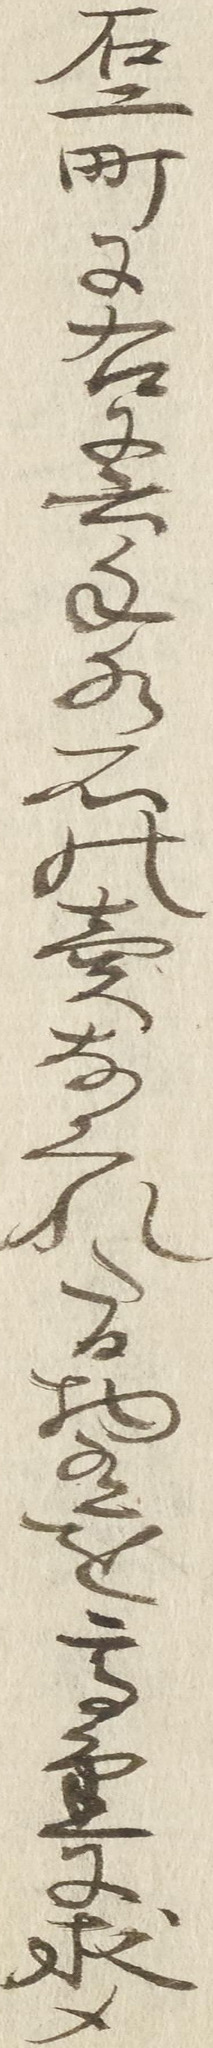石工町に右に云手水石の売なくれたる物有を高金に求め
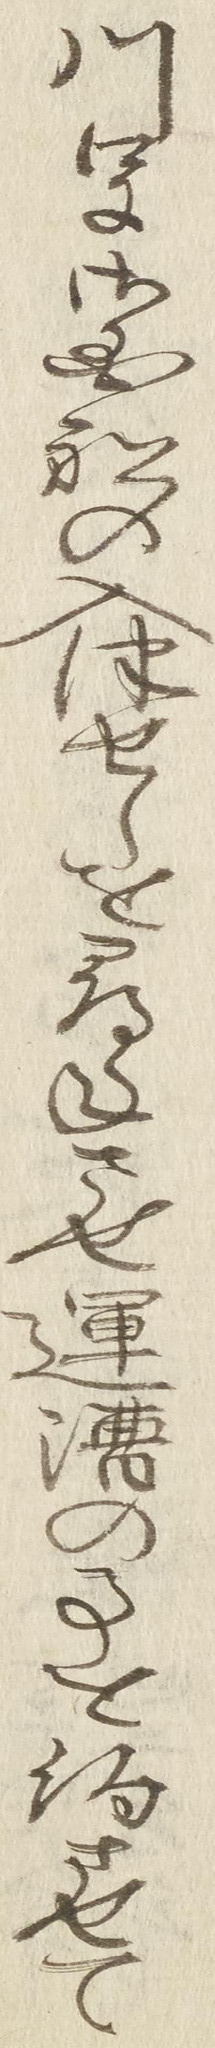川口に御国船の入津せしを尋ねさせ運漕の事を約させて
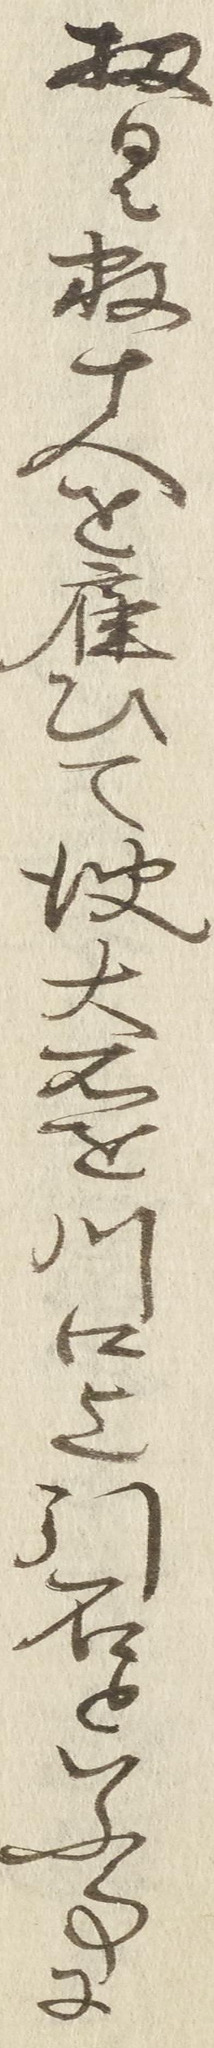扨日々数十人を雇ひて彼大石を川口迄引石といふ事に
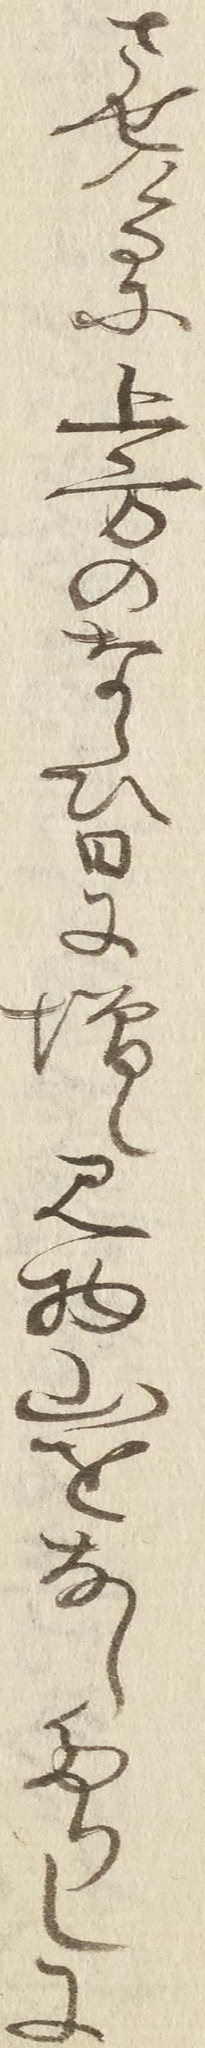させけるに上方のならひ日に増し見物山をなしたりしに
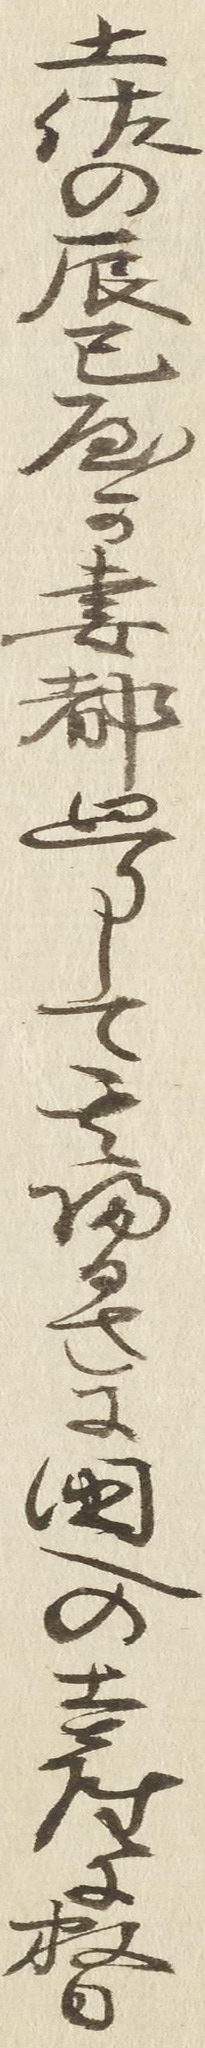土佐の辰巳屋か妻都廻りして其帰るさに国への土産に数日
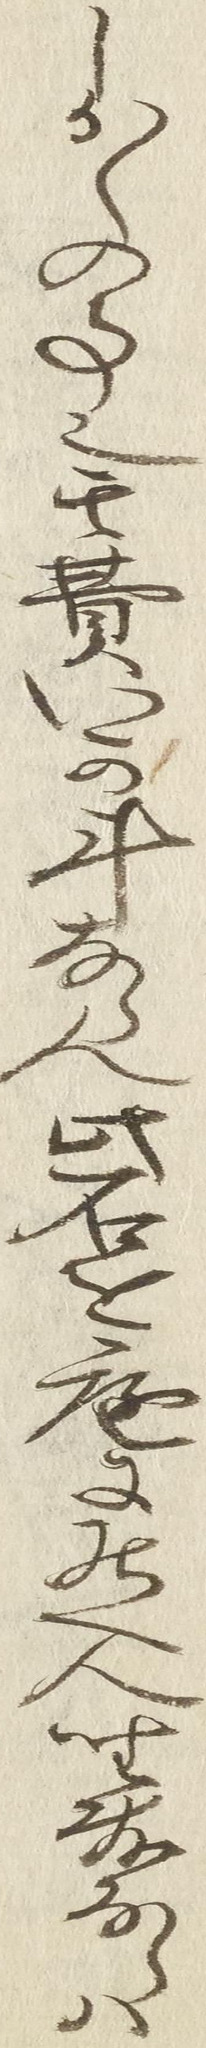しか〳〵の事也其費いか斗ならん此石を庭に居へ人座敷ならは
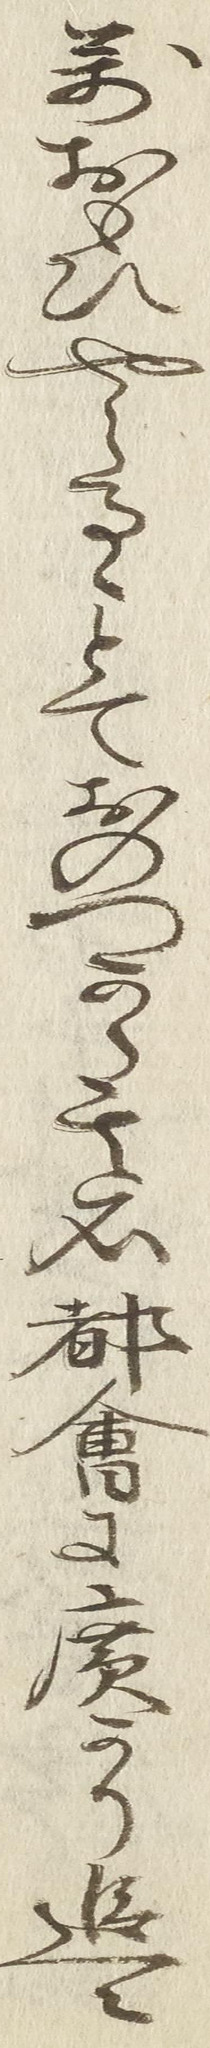萬おもひやらるゝとておのつから其石都會に広かり追々
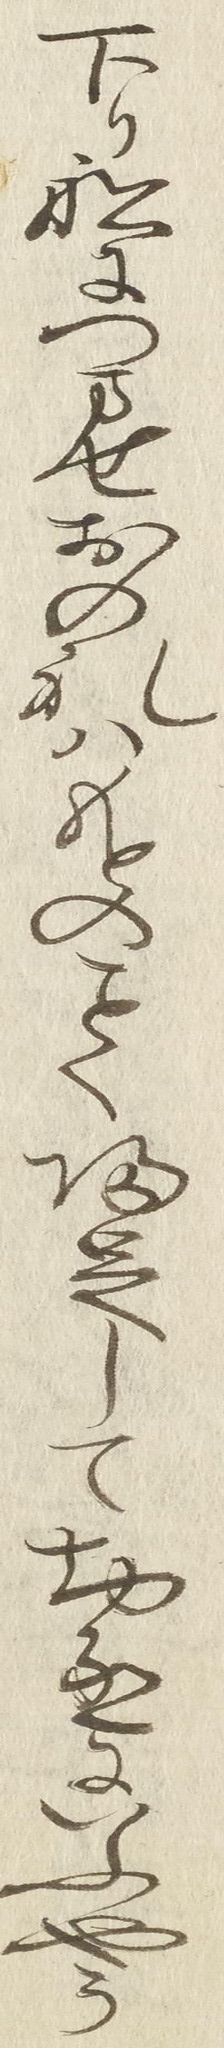下り船につませおのれはもとのことく帰足して勘丞にいふやう
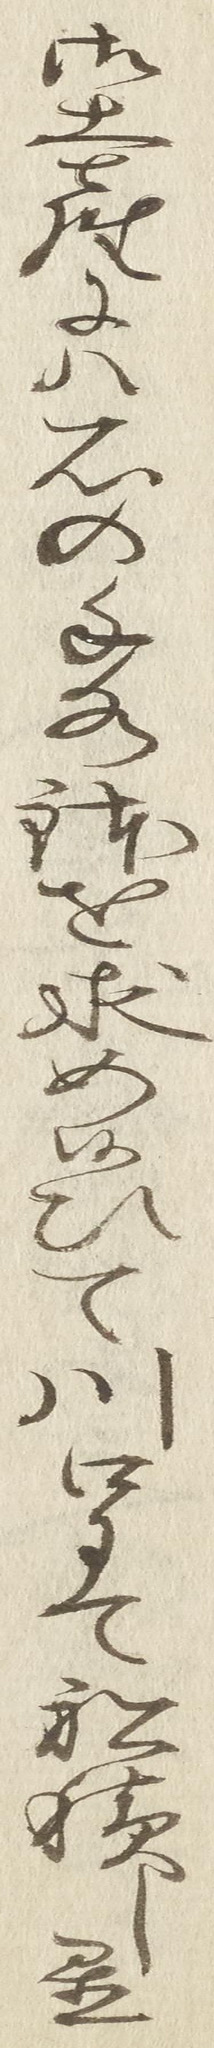御土産には石の手水鉢を求め候ひて川口にて船積し置
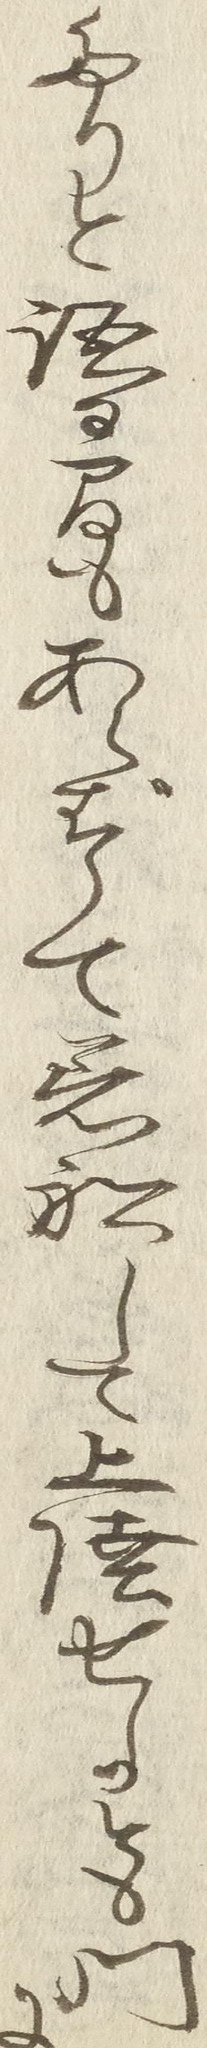たりと語る間もあらすして着船して上陸せしかとも門に
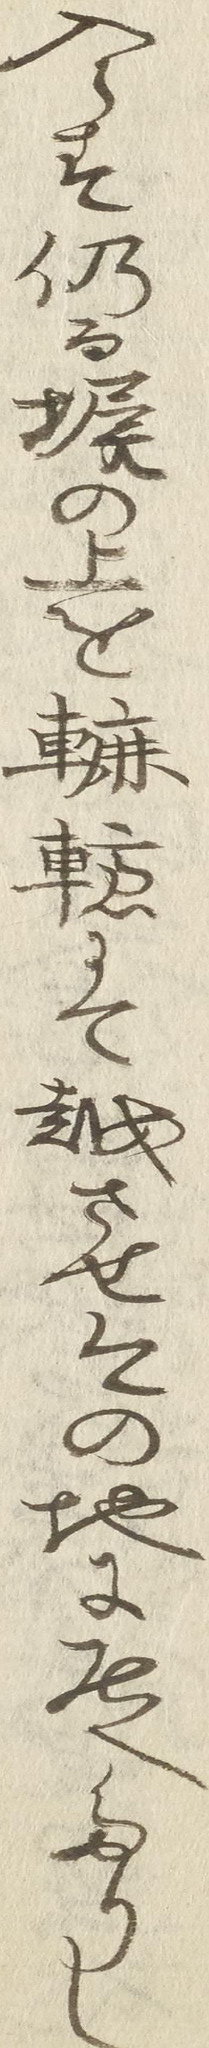入らす仍て塀の上を轆轤にて越させ今の地に居へたりし
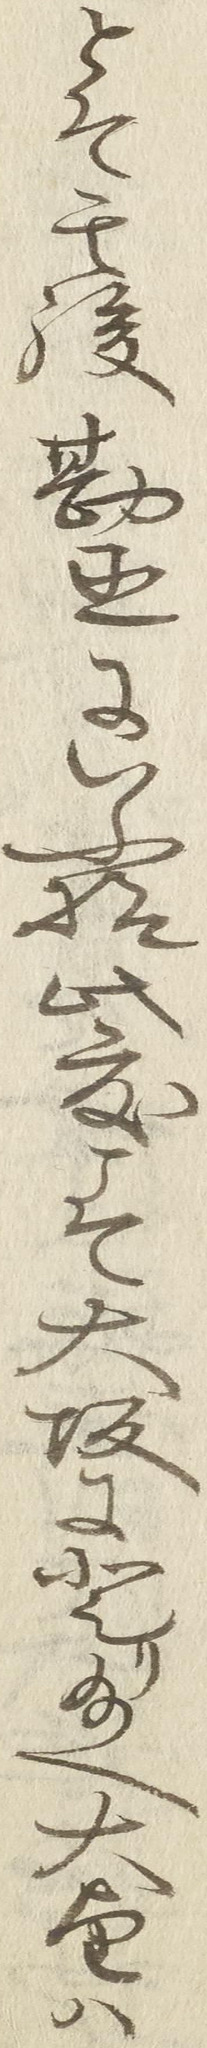とそ其後勘丞にいふ様此度さて大坂に登り給へ大望は
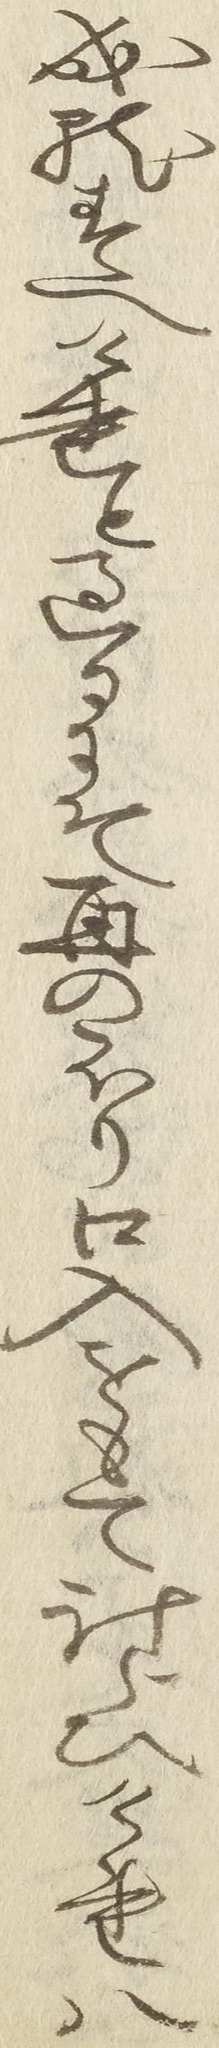成就すへけれと過日にぞ再のほり口入をもて計らひけれは
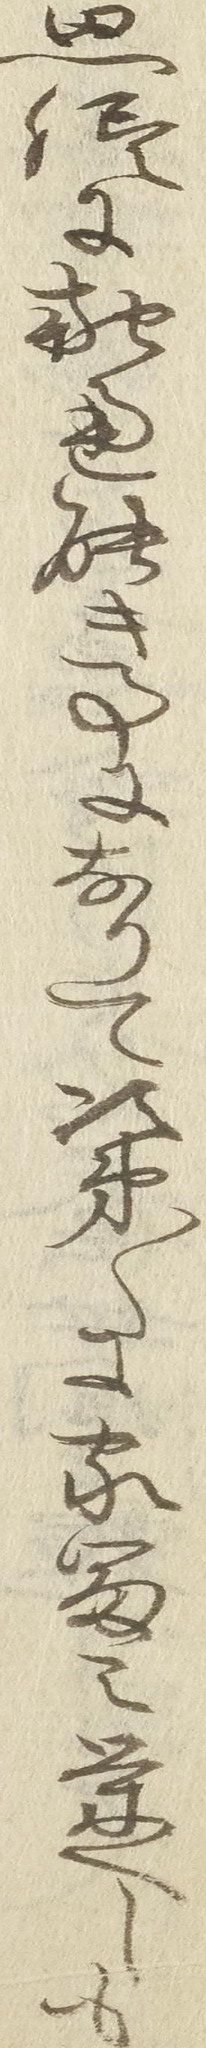思侭に融通能き事になりて次第〳〵に家富の栄へしも

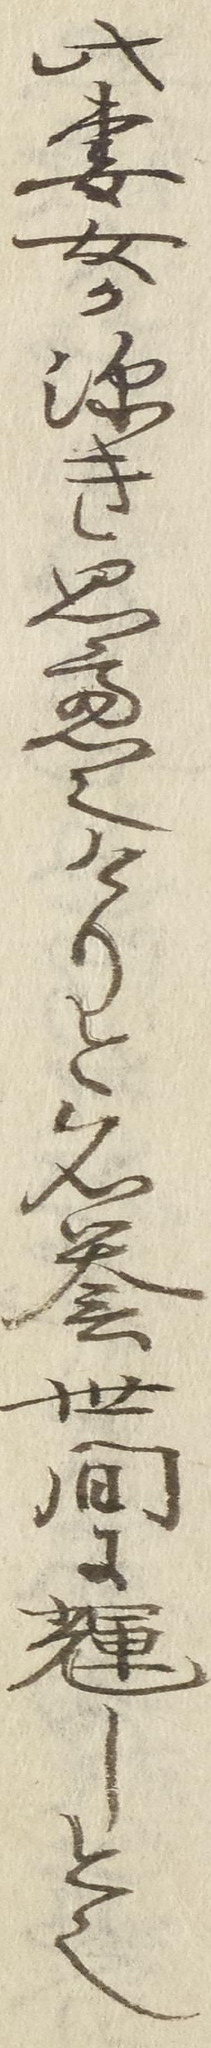此妻女か深き思慮也けりと名誉世間に輝しと也
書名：地震記　上
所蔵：東京大学地震研究所図書室 Earthquake Research Institute Library, The University of Tokyo, JAPAN
